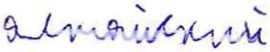ялтайский
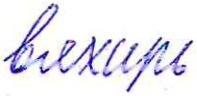вяхирь
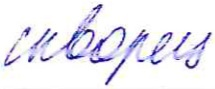скворец
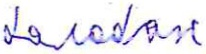балобан
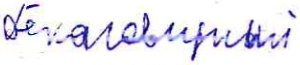бекаговидный
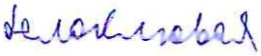белоклювая
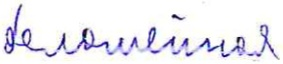белошейная
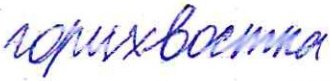горихвостка
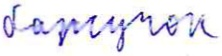барсучок
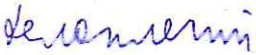белоплечий
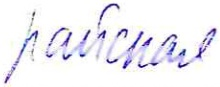райская
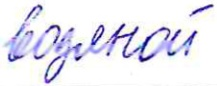водяной
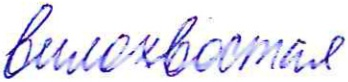вилохвостая
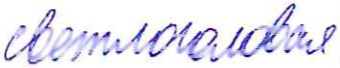светлоголовая
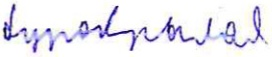бурокрылая
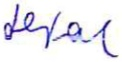бекас
